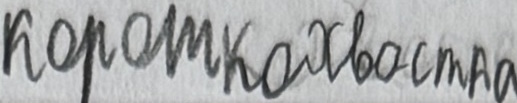короткохвостка
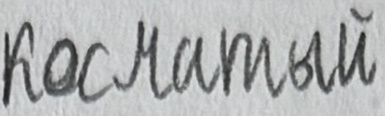косматый
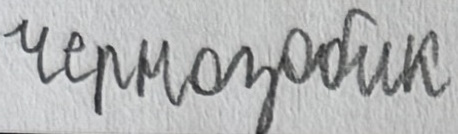чернозобик
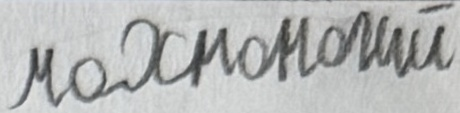мохноногий
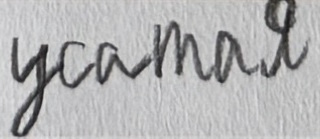усатая
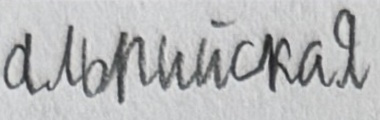альпийская
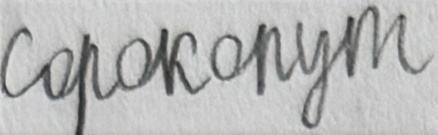сорокопут
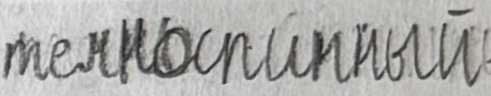темноспинный
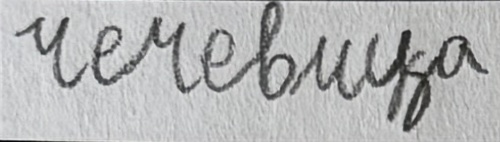чечевица
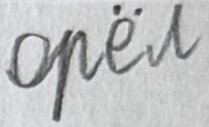орёл
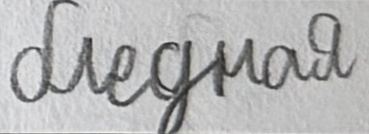бледная
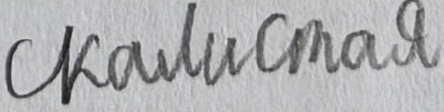скалистая
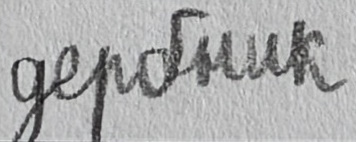дербник
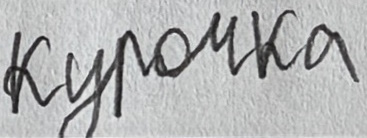курочка
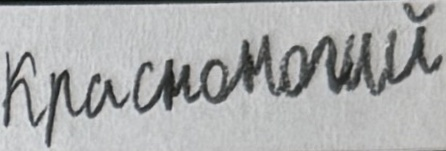красноногий
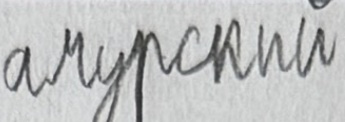амурский
